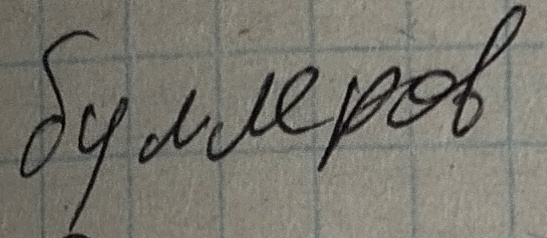буллеров
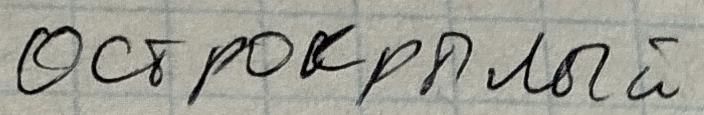острокрылый
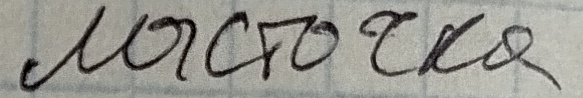ласточка
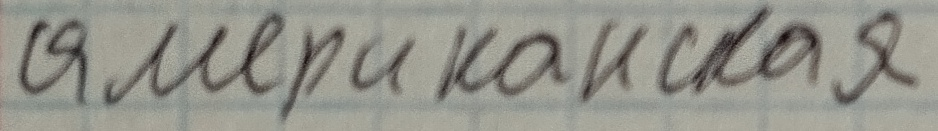американская
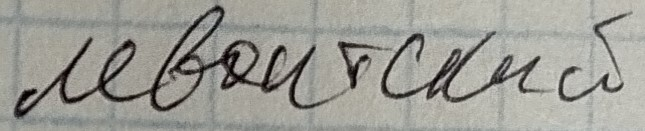левантский
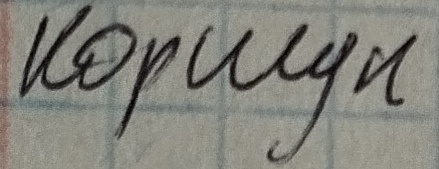коршун
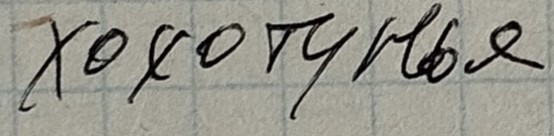хохотунья
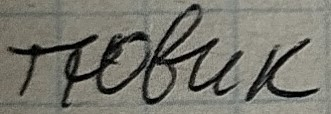тювик
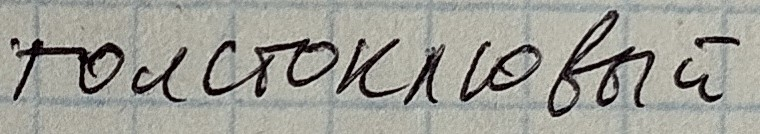толстоклювый
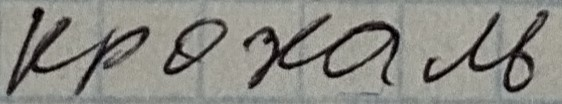крохаль
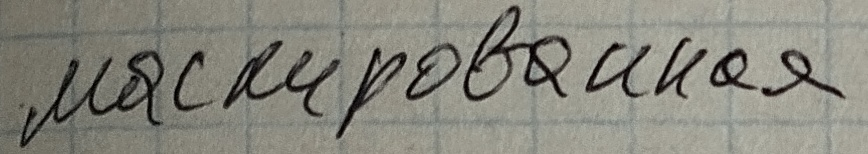маскированная
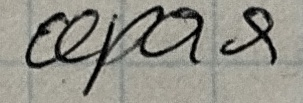серая
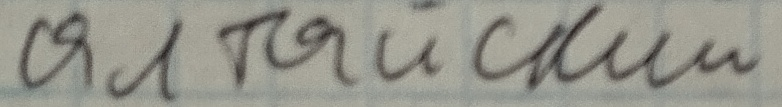алтайский
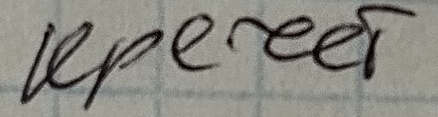кречет
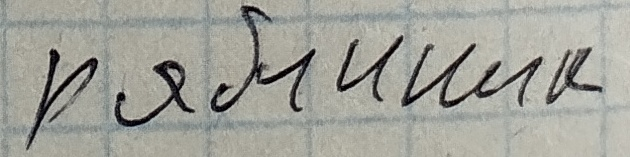рябинник
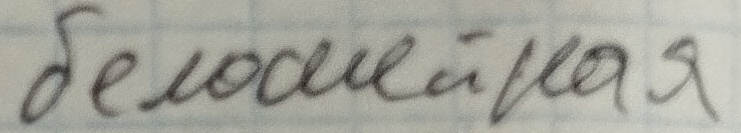белошейная
